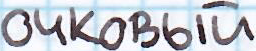очковый
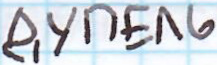дупель
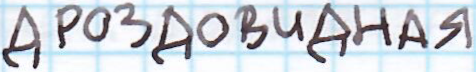дроздовидная
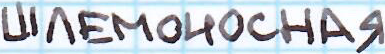шлемоносная
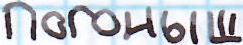погоныш
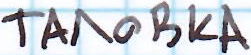таловка
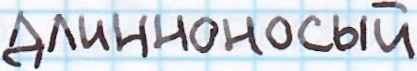длинноносый
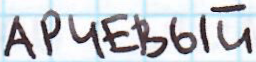арчевый
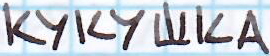кукушка
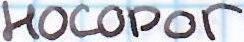носорог
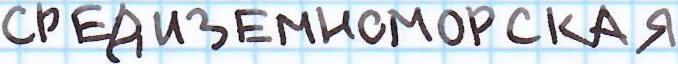средиземноморская
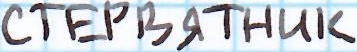стервятник
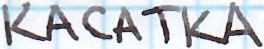касатка
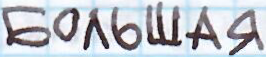большая
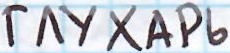глухарь
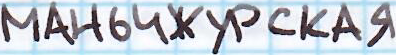маньчжурская
